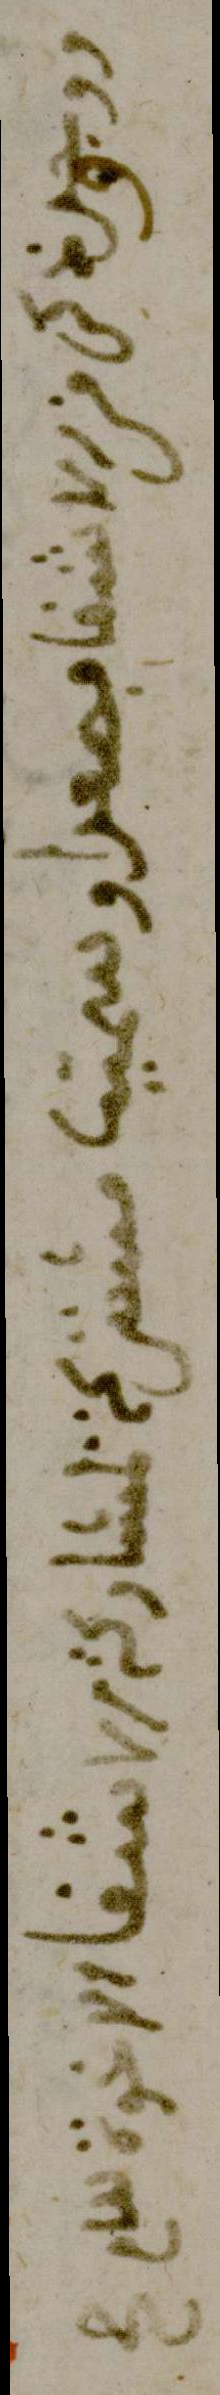ووجود ذكر من الاشقا فصعدا وسميت مشتركة المشاركة الاشقا الاخوة للام صح
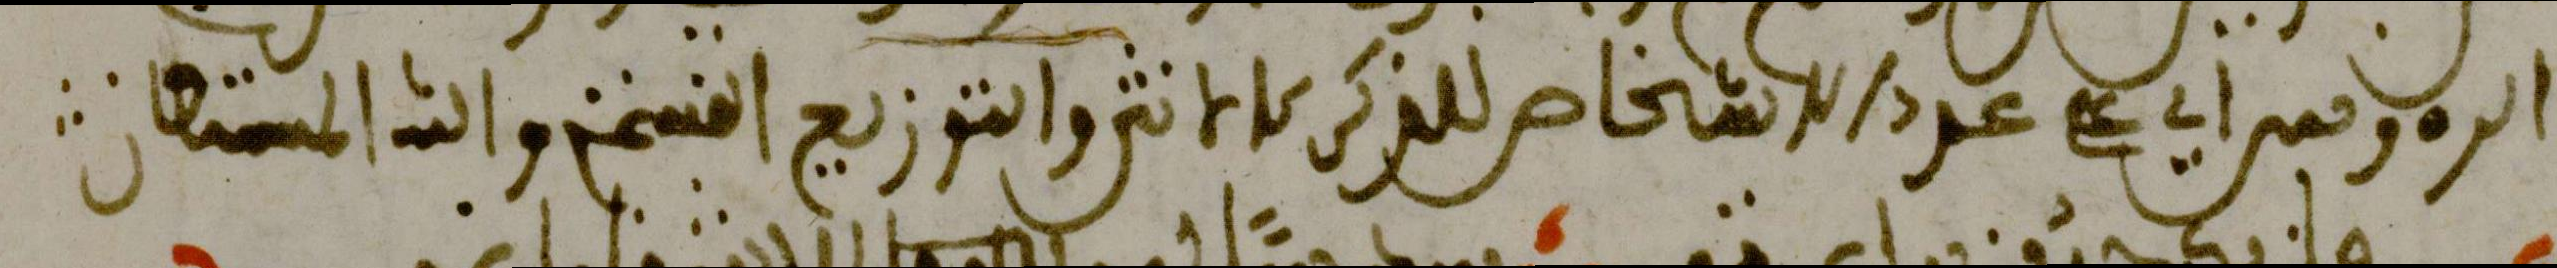الرءوس اي على عدد الاشخاص للذكر كالانثى والتوزيع القسمة والله المستعان
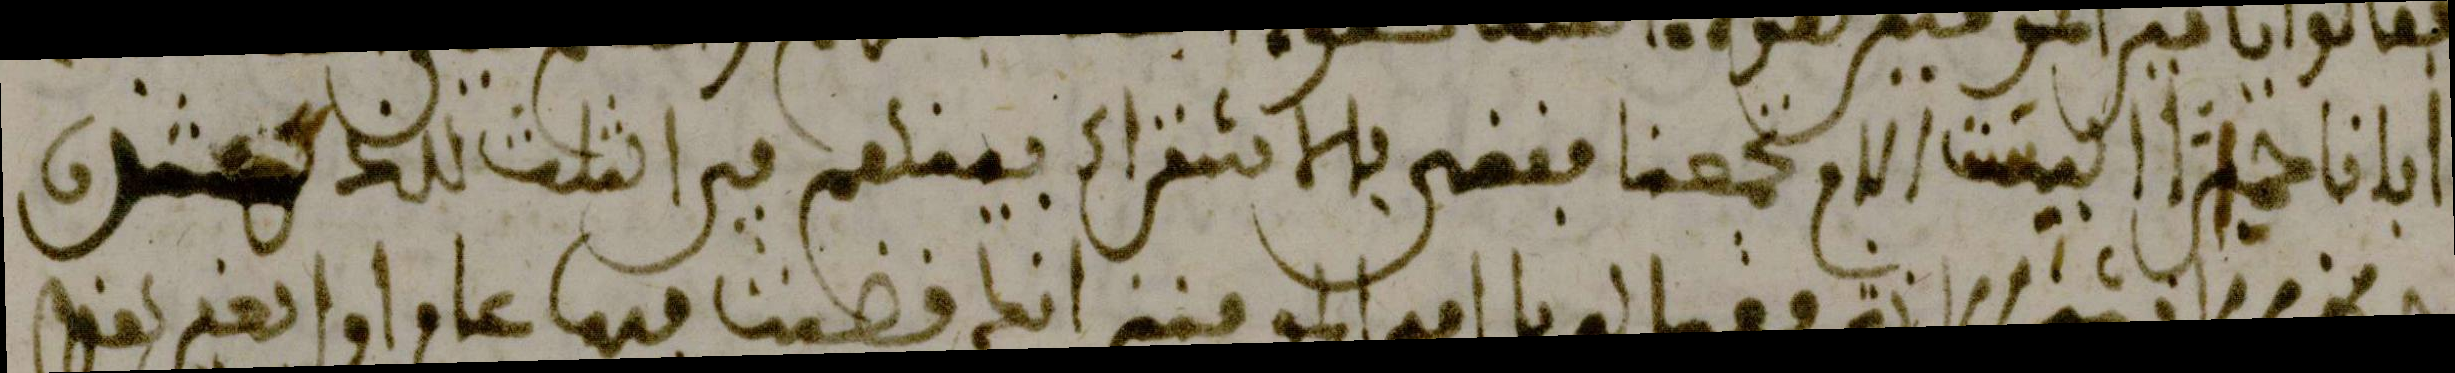ابانا حمارا اليس الام تجمعنا فقضى بالاشتراك بينهم في الثلث للذكر مثل
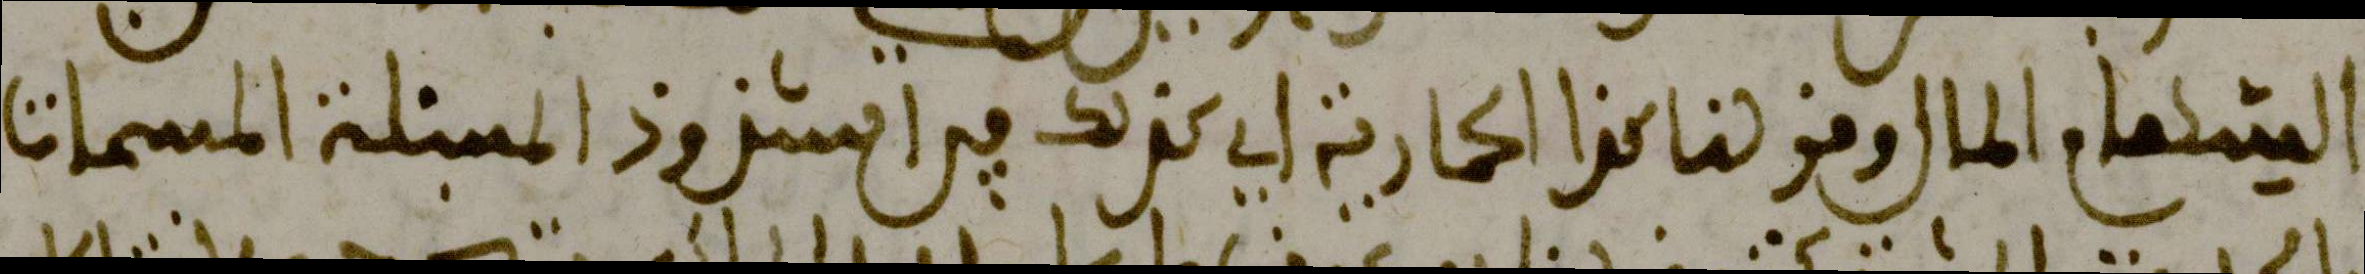السِّهام المال وقولنا كذا الحمارية اي كذلك في الشذوذ المسئلة المسمات
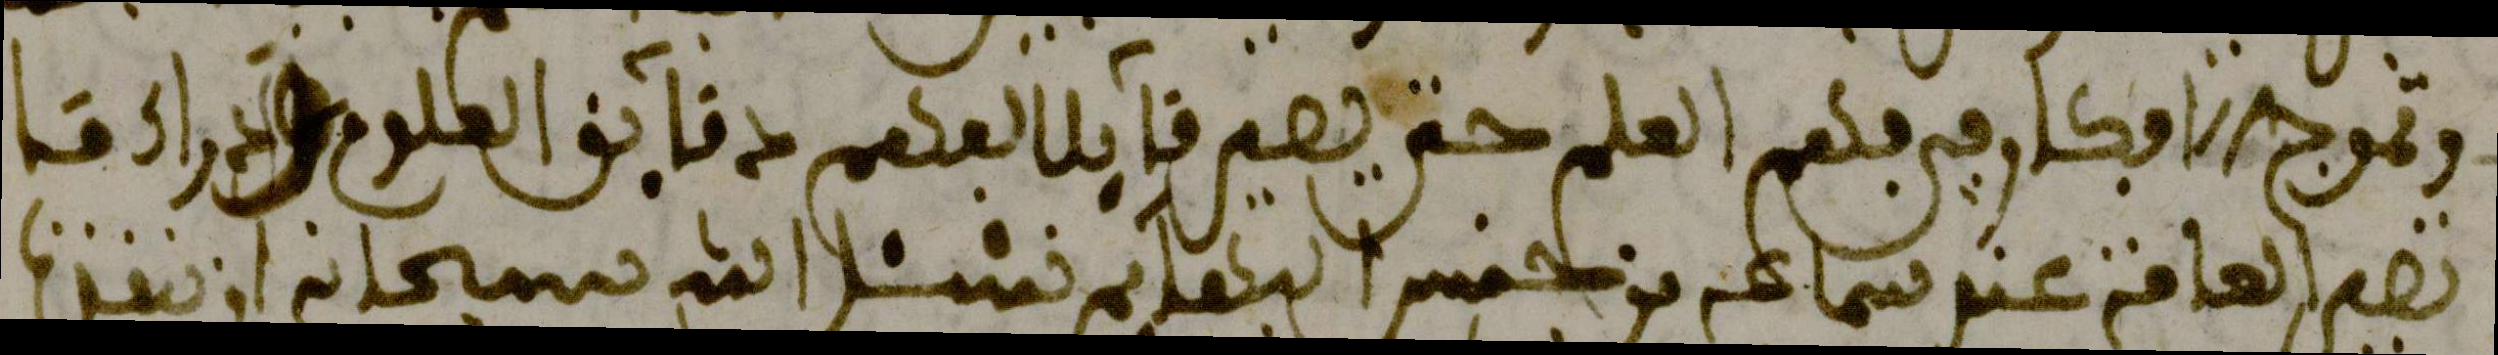وتموج الافكار في فهم العلم حتى يصير قائلا لفهم دقائق العلوم وادراك ما
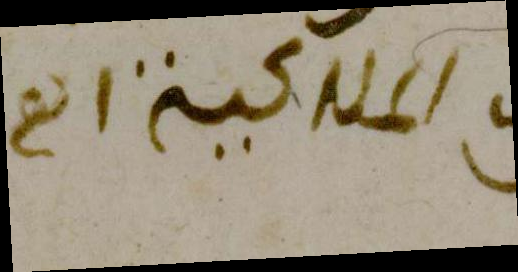الملاكية اىم
